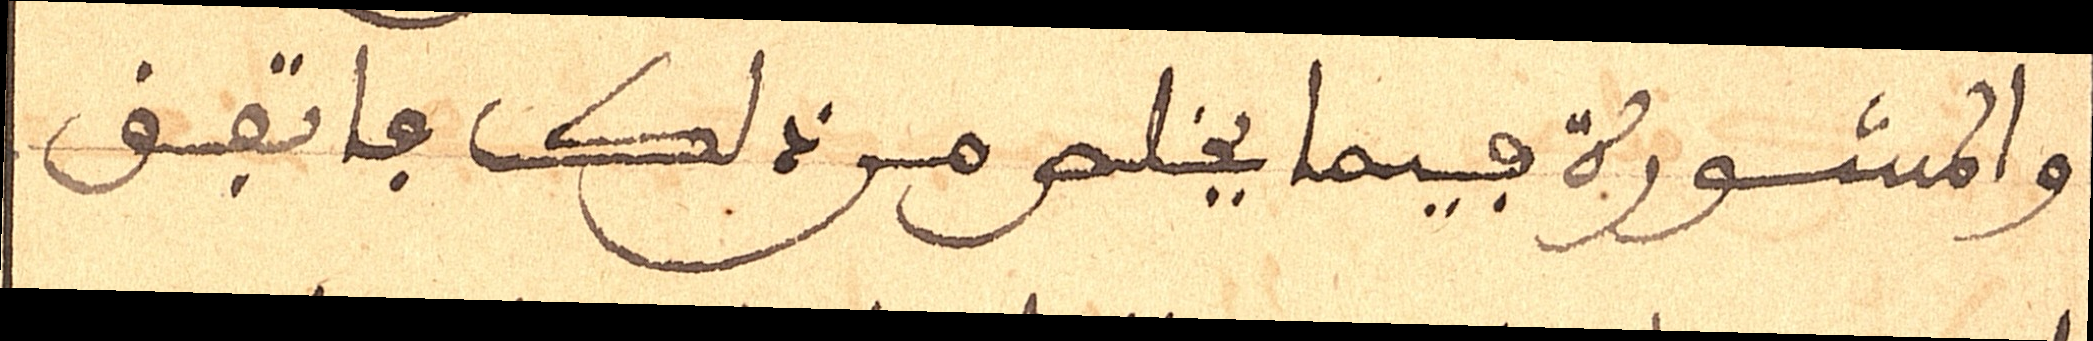المشورة فيما يخلص من ذلك فاتفق
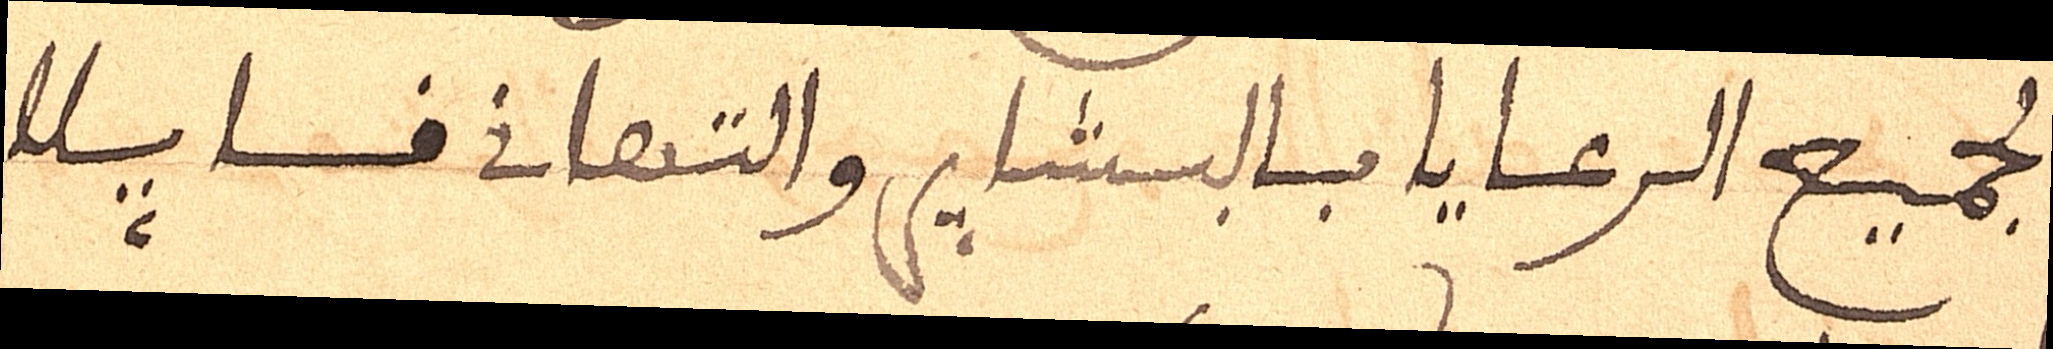لجميع الرعايا بالبشائر والتهانى قائلا
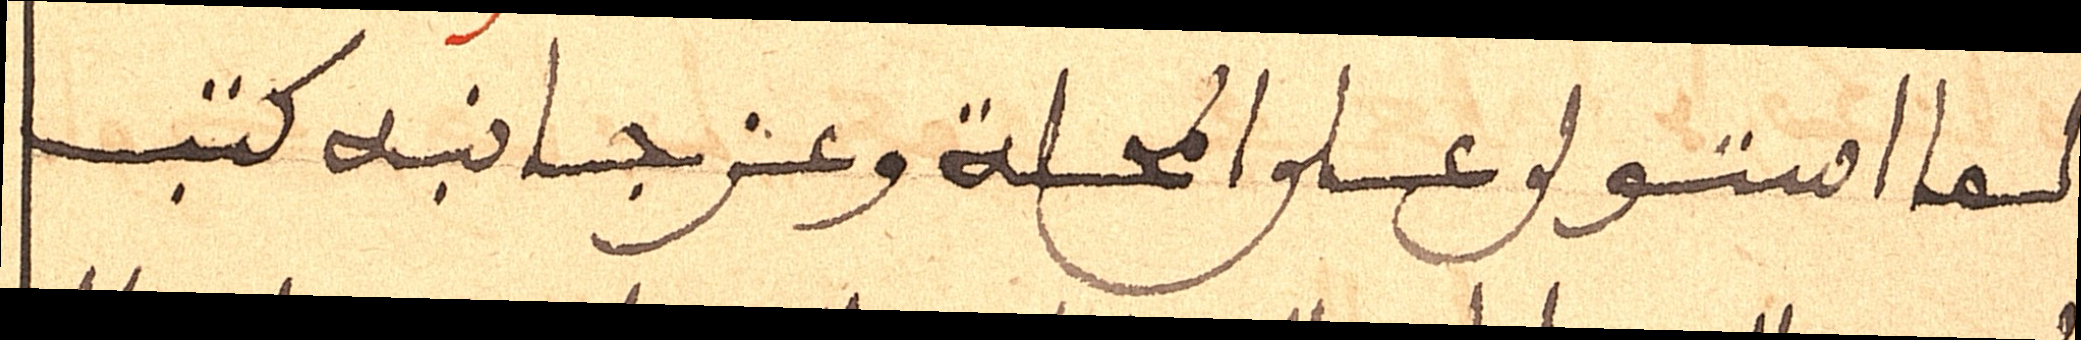لما استولى على المحلة وعز جانبه كتب
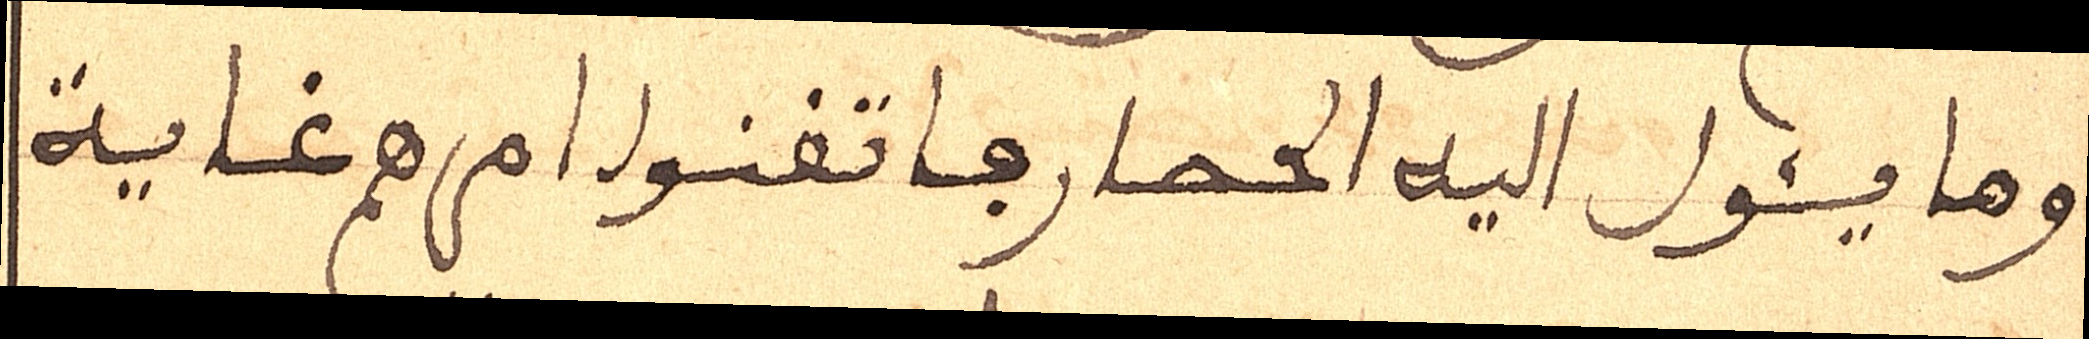وما يؤل اليه الحصار فاتقنوا امرهم غاية
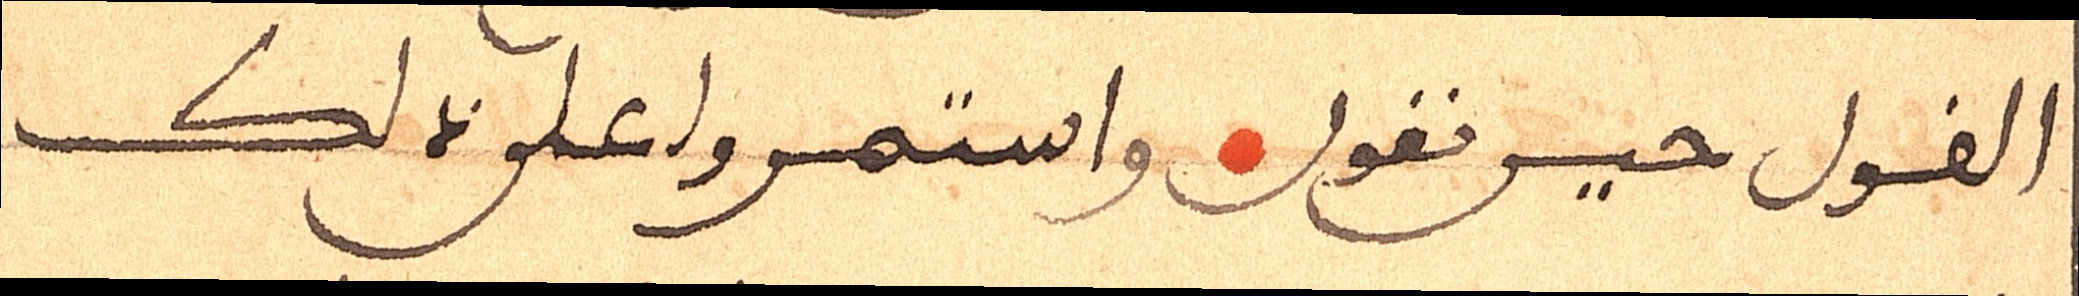القول حين نقول واستمر واعلى ذلك
